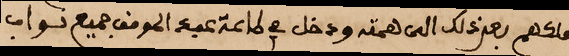ملكهم بعد ذلك الى همته ودخل في طاعة عبد المومن جميع نواب
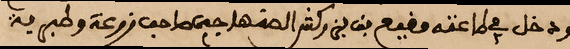ودخل في طاعته وضيع بن بزركش الصنهاجي صاحب زرعة وطبرية
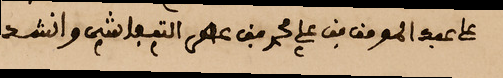على عبد المومن بن علي محمد بن عمر التيفاشي وانشد
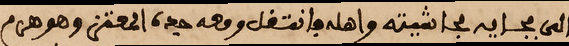الى بجاية بحاشيته واهله فانتقل ومعه جده المعتز وهو هرم
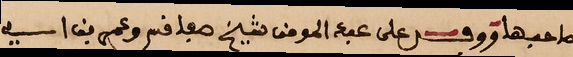صاحبها ووفد على عبد المومن شيخ صفاقس وعمر بن ابي
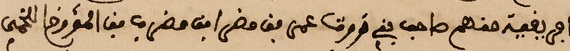افريقية منهم صاحب بني تورت عمر بن مضر ابن مضرب بن المؤرخ اللخمي
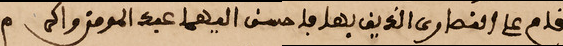قام على النصارى الذين بها فاحسن اليهما عبد المومن واكرم
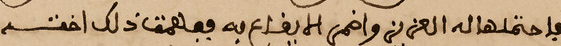فاحتملها له العزيز واضمر الايقاع به ففهمت ذلك اخته
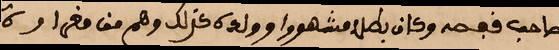صاحب قفصة وكان بطلا مشهورا وولده كذلك وهم من مغراوة
